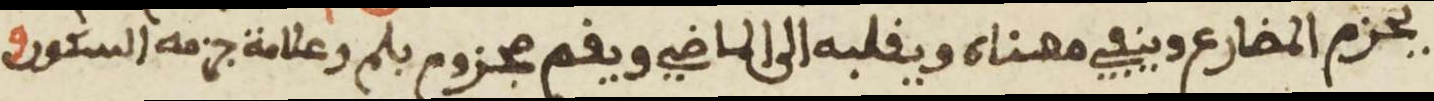يجزم المضارع و ينفي معناه و يقلبه الى الماضي و يقم مجزوم بلم و علامة جزمه السكون و
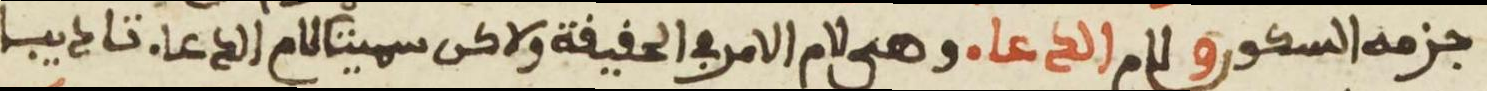جزمه السكون و لام الدعاء و هى لام الامر في الحقيقة و لاكن سميت لام الدعاء تاديبا
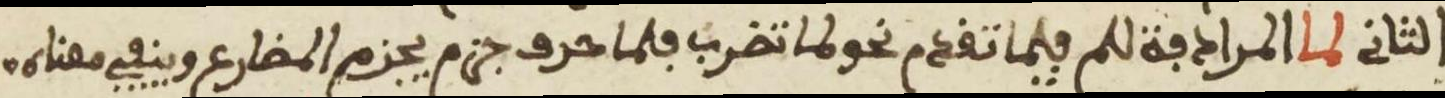الثاني لما المرادفة للم فيما تقدم نحو لما تضرب فلما حرف جزم يجزم المضارع و ينفي معناه
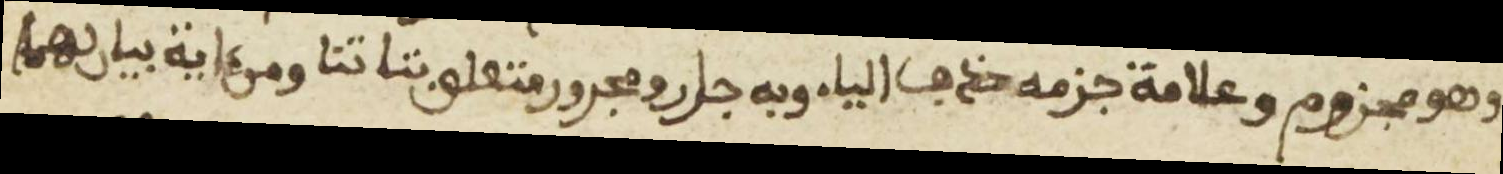و هو مجزوم و علامة جزمه حذف الياء و به جار و مجرور متعلق بتاتنا و من ءاية بيان لهما
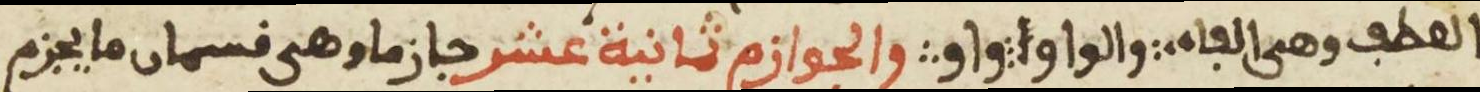العطف و هي الفاء و الواو واو و الجوازم ثمانية عشر جازما و هي قسمان ما يجزم
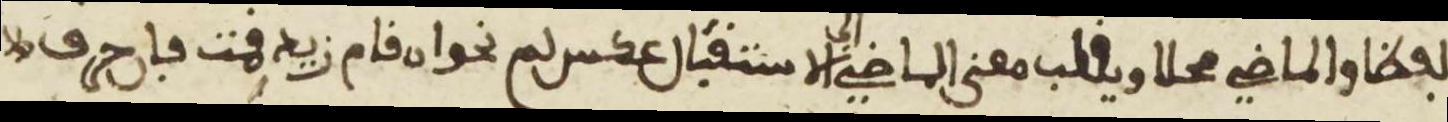لفظا و الماضي محلا و يقلب معنى الماضي الاستقبال عكس لم نحو ان قام زيد قمت فان حرف
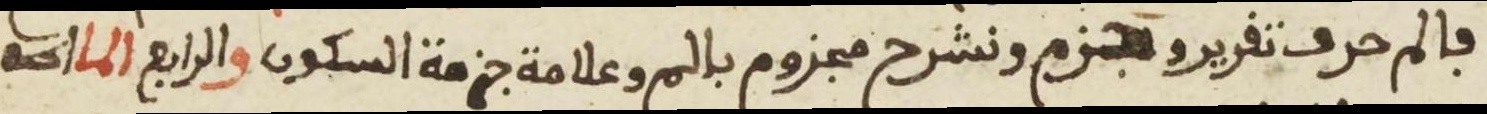فالم حرف تقرير و جزم و نشرح مجزوم بالم و علامة جزمه السكون و الرابع الما ###
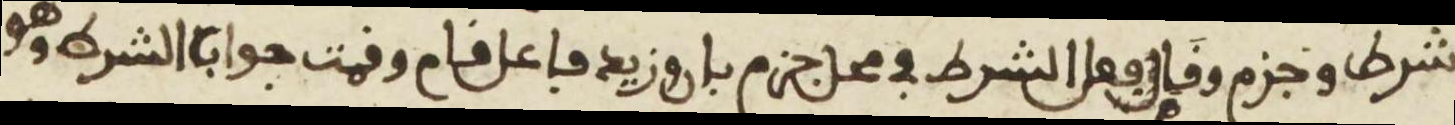شرط و جزم و قام فعل الشرط في محل جزم بان و زيد فاعل قام و قمت جواب الشرط و هو
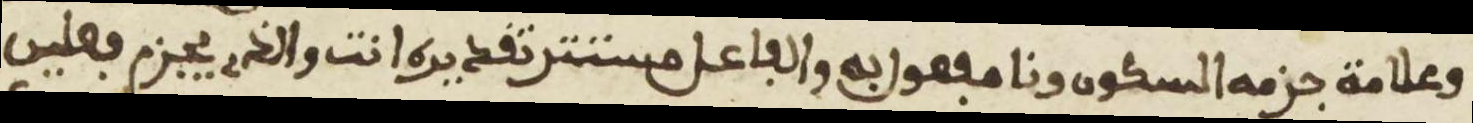و علامة جزمه السكون و نا مفعول به و الفاعل مستتر تقديره انت و الذي يجزم المضارع
